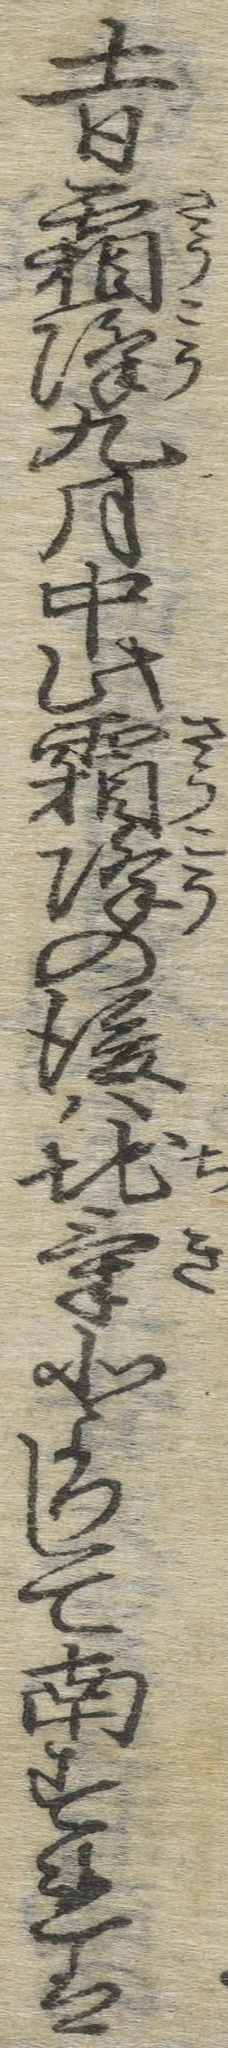十一日霜降九月中此霜降の後は地気北よりして南すれは
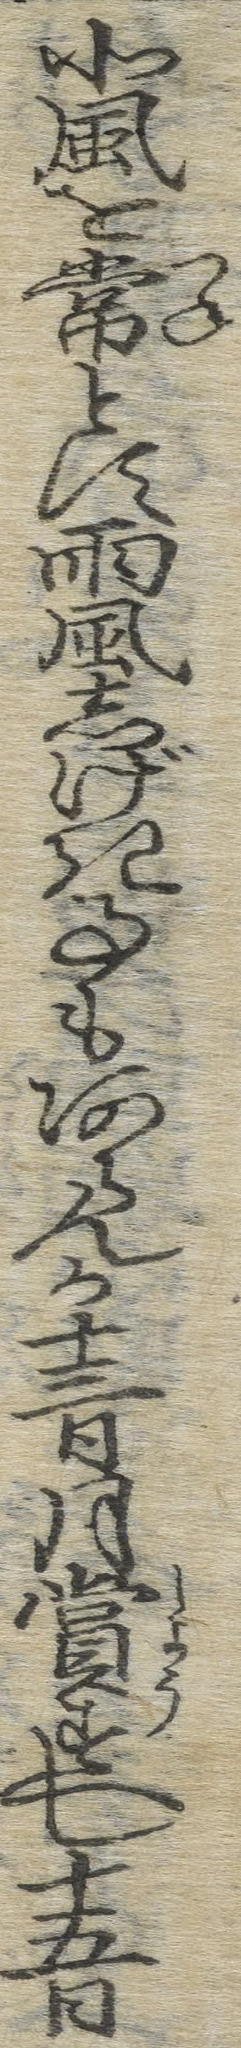北風を常とす雨風しげき事もあらんか十三日月賞すへし十五日
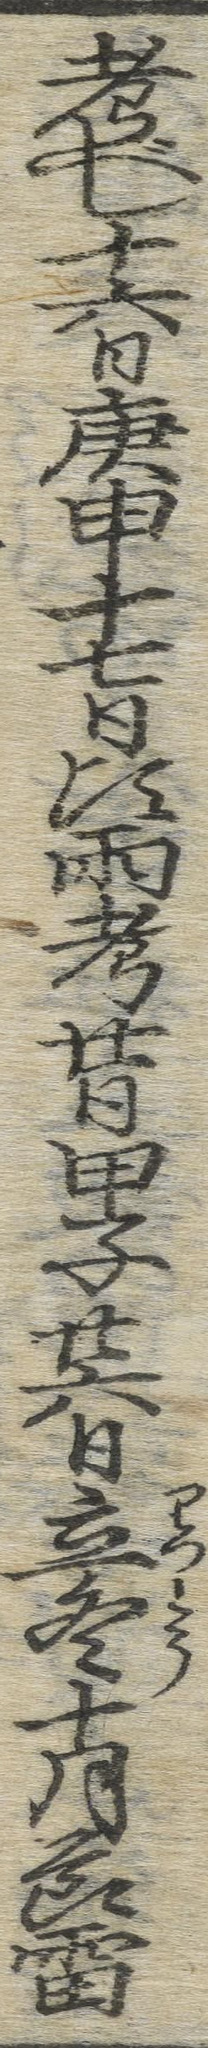考べし十六日庚申十七日頃雨考廿日甲子廿六日立冬十月節雷
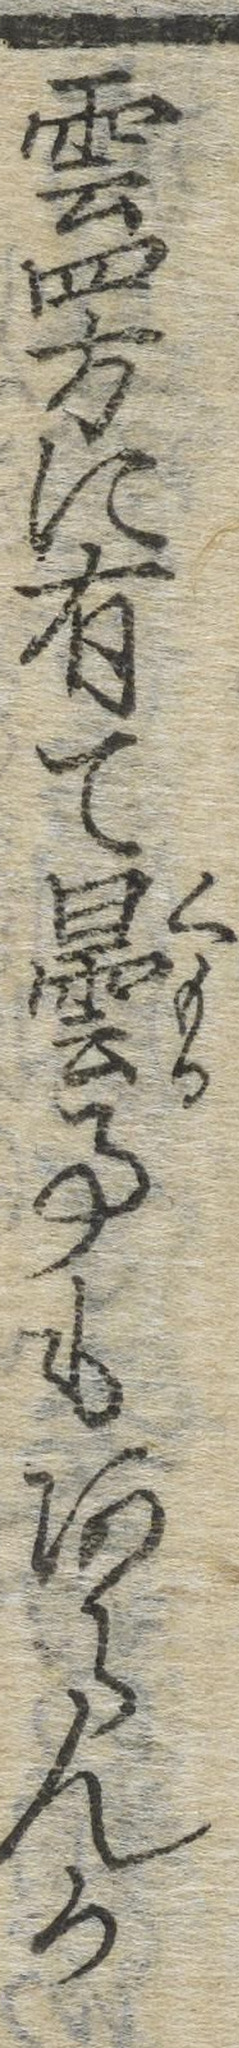雲四方に有て曇事もあらんか
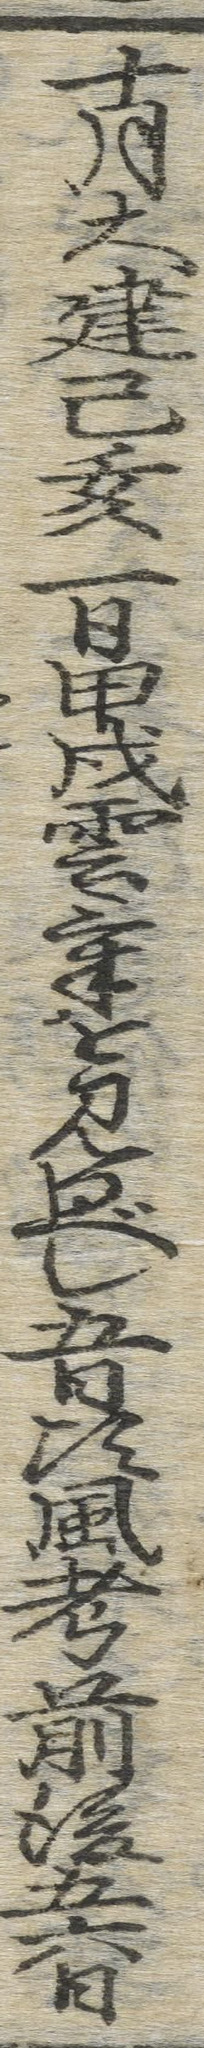十月大建己亥一日甲戌雲気を見るべし五日頃風考前後五六日
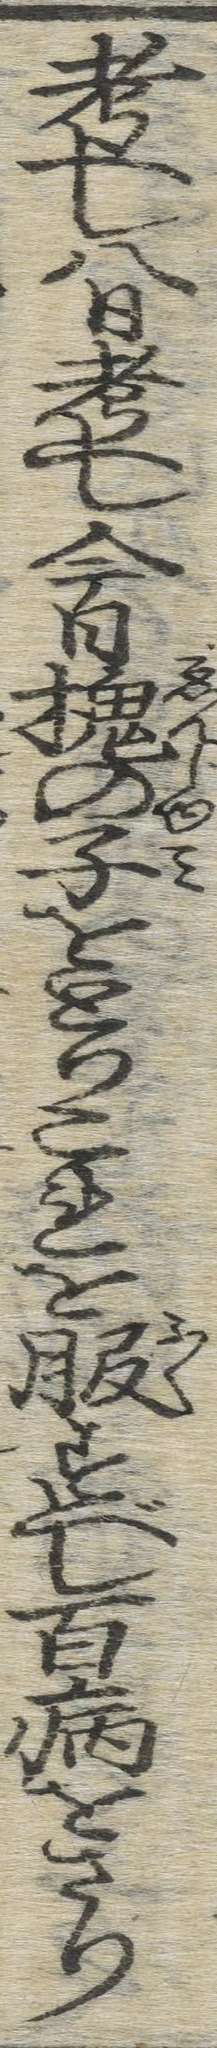考へし八日考へし今日槐の子をとりこれを服すべし百病をさり
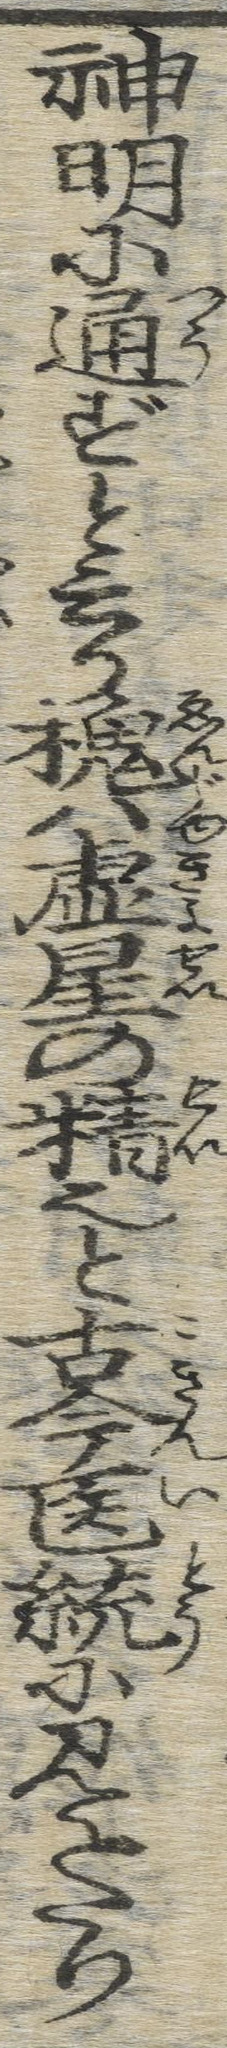神明に通ずと云り槐は虚星の精也と古今医統に見えたり
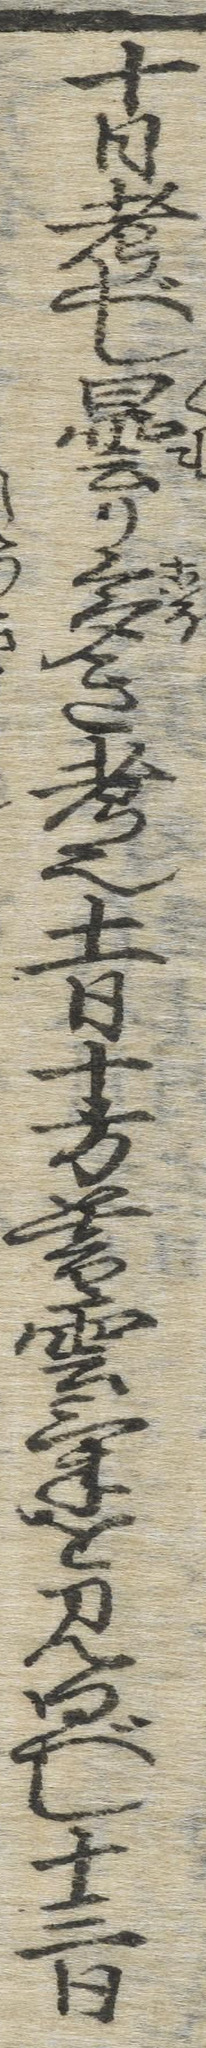十日考べし曇り多き考也十一日十方暮雲気を見るべし十三日
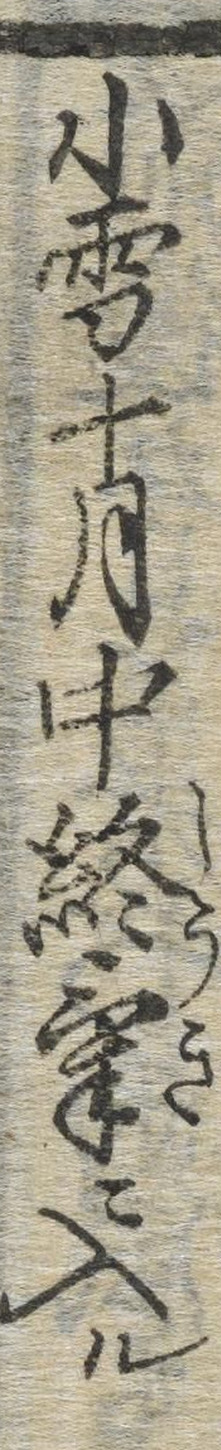小雪十月中終気に入る
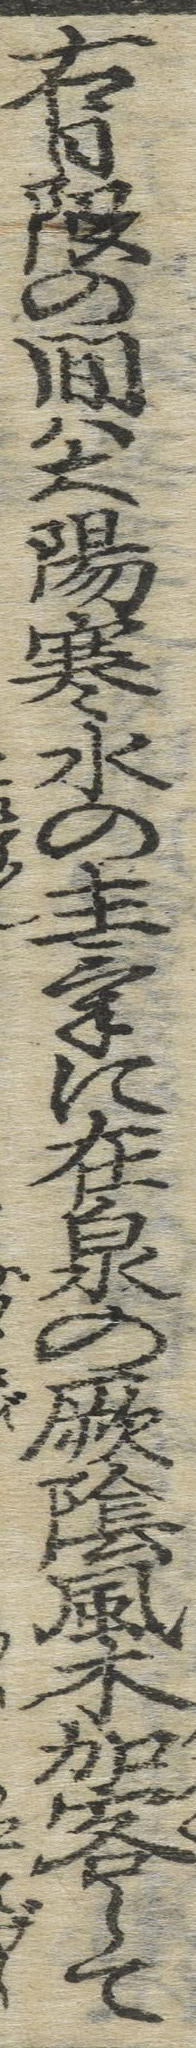右日限の間は大陽寒水の主気に在泉の厥陰風木加客して
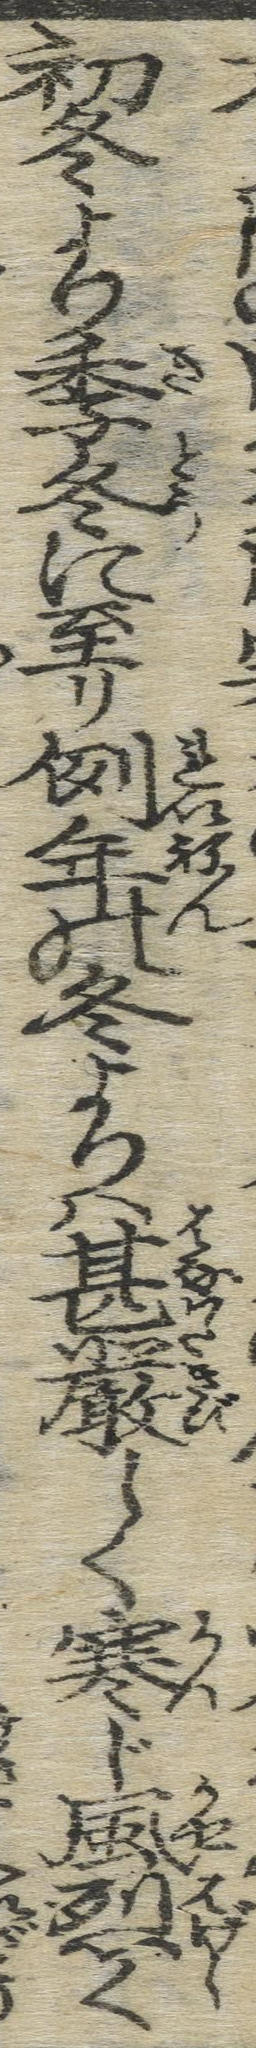初冬より季冬に至り例年の冬よりは甚厳しく寒じ風烈く
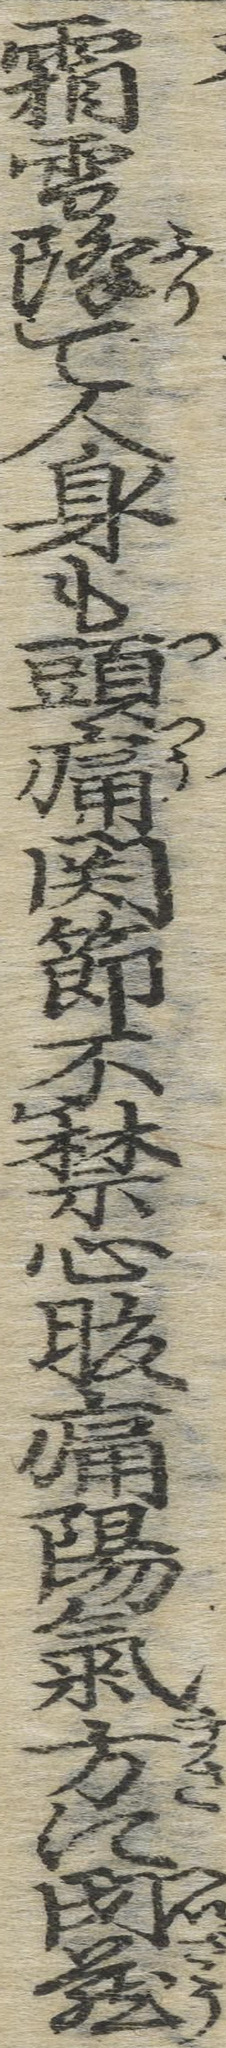霜雪降て人身も頭痛関節不禁心腹痛陽気方に閉蔵
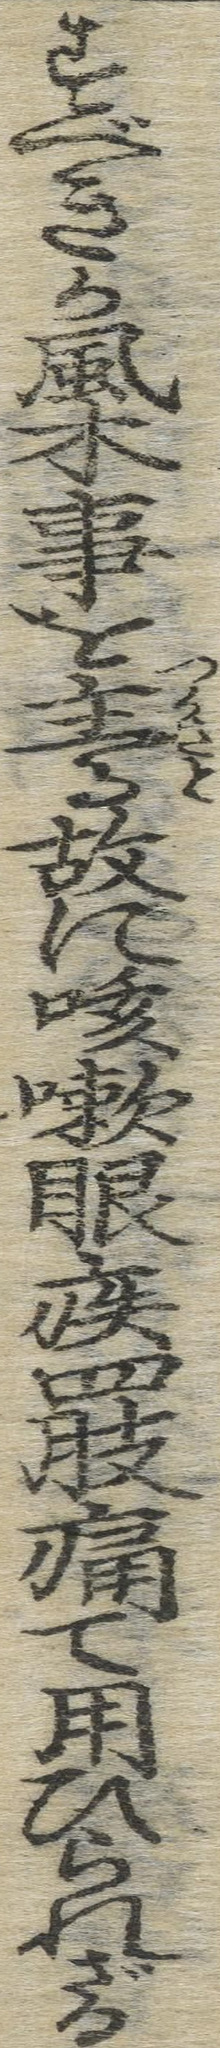すべきか風木事を主る故に咳嗽眼疾四肢痛て用ひられざる
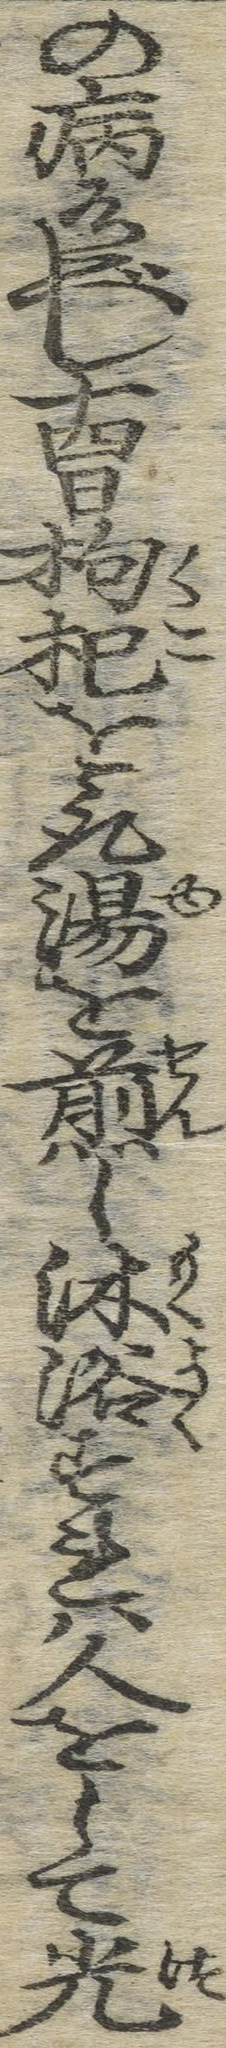の病有べし十四日枸杞を取湯を煎し沐浴すれは人をして光
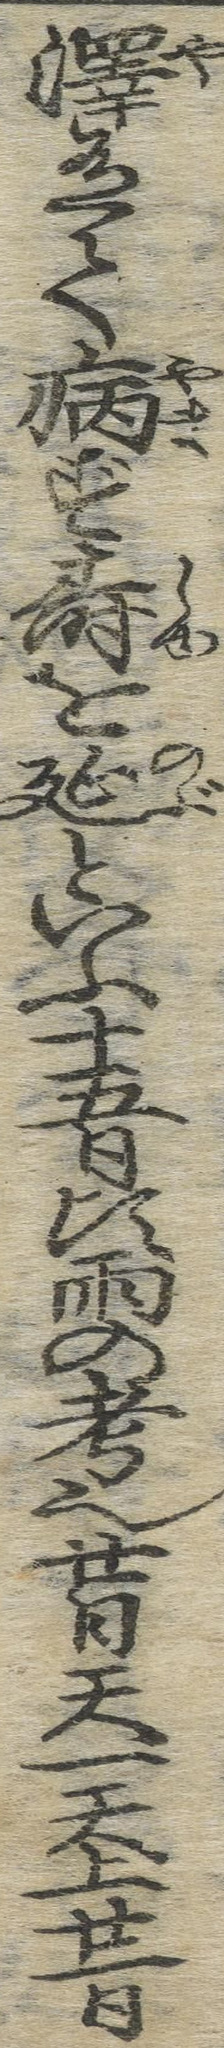沢有て病ず寿を延といふ十五日頃雨の考也廿日天一天上廿一日
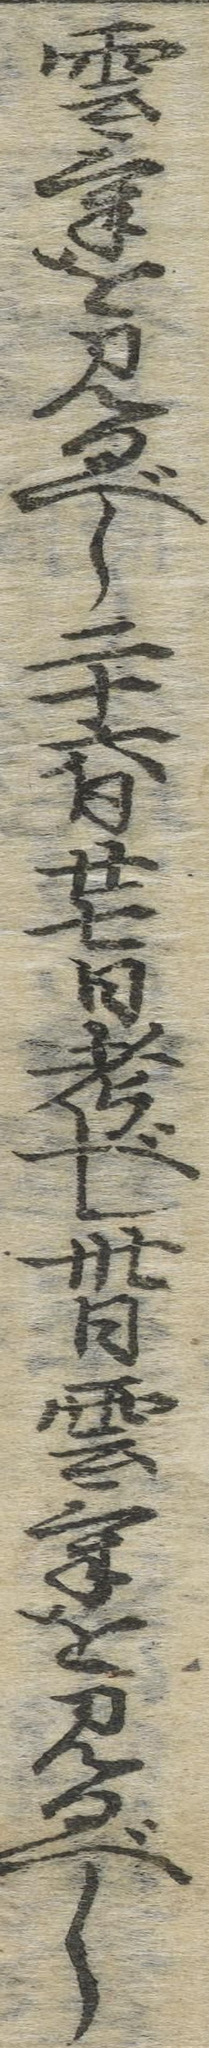雲気を見るべし二十六日廿七日考べし卅日雲気を見るべし
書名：[晴雨考]
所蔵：東京大学地震研究所図書室 Earthquake Research Institute Library, The University of Tokyo, JAPAN
